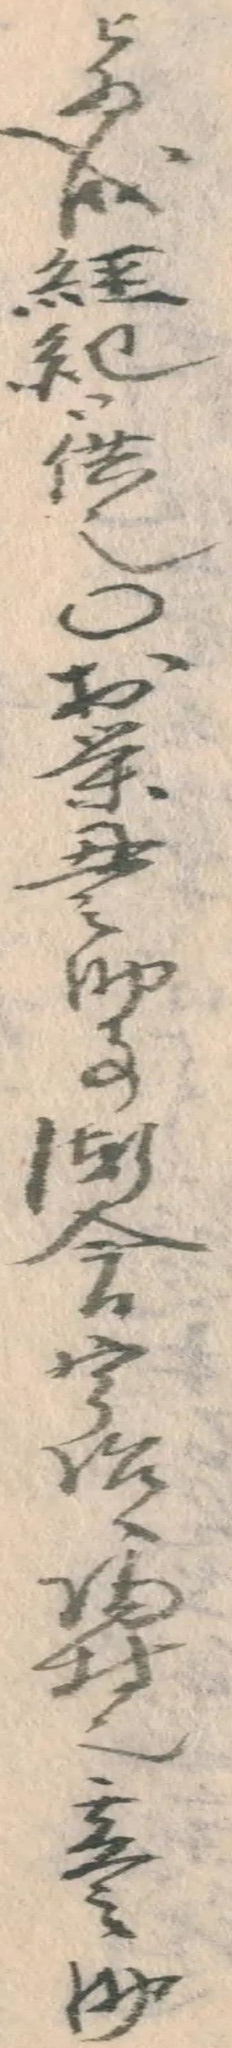被為成経紀御供也〇お栄丑之助事漸今日宇治へ帰村也亥之助
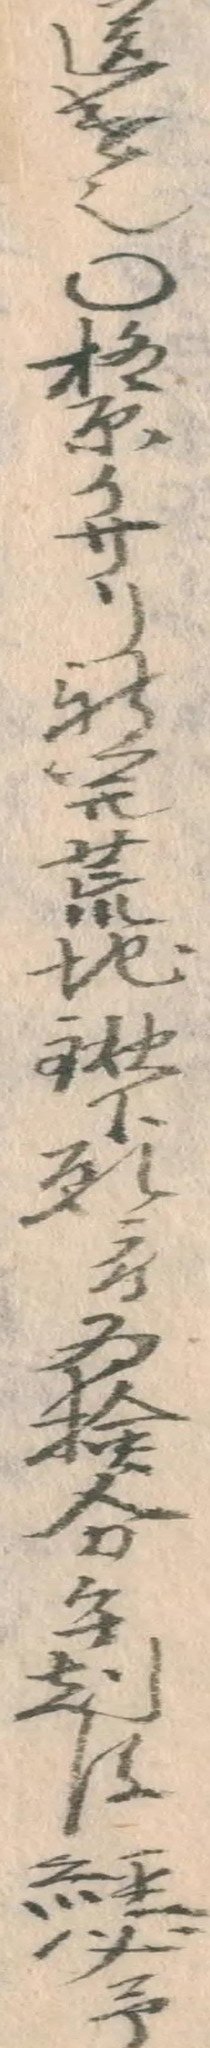送遣也○柊原イサリ新開荒地鍬下願ニ付為検分午刻後経必予
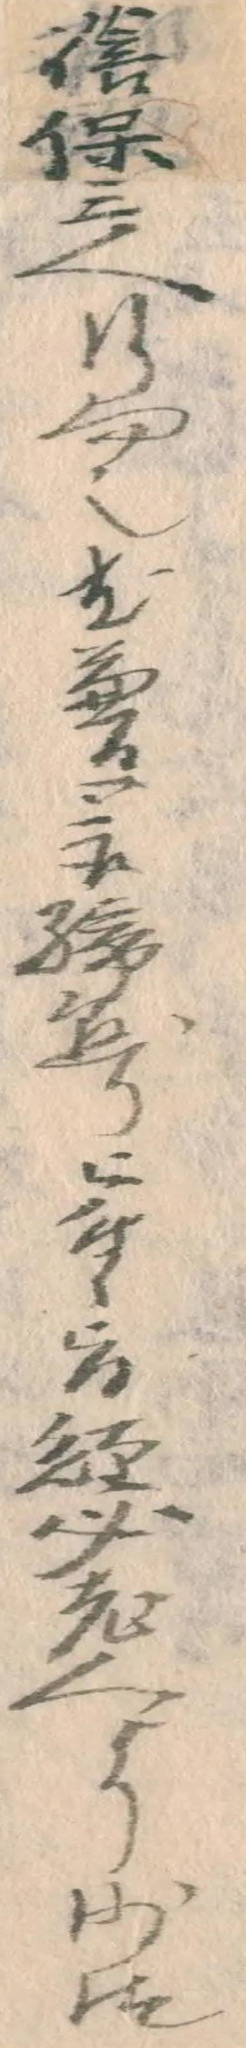蓓保三人引向也尤兼而御取締懸り被付候旨経必老人より沙汰
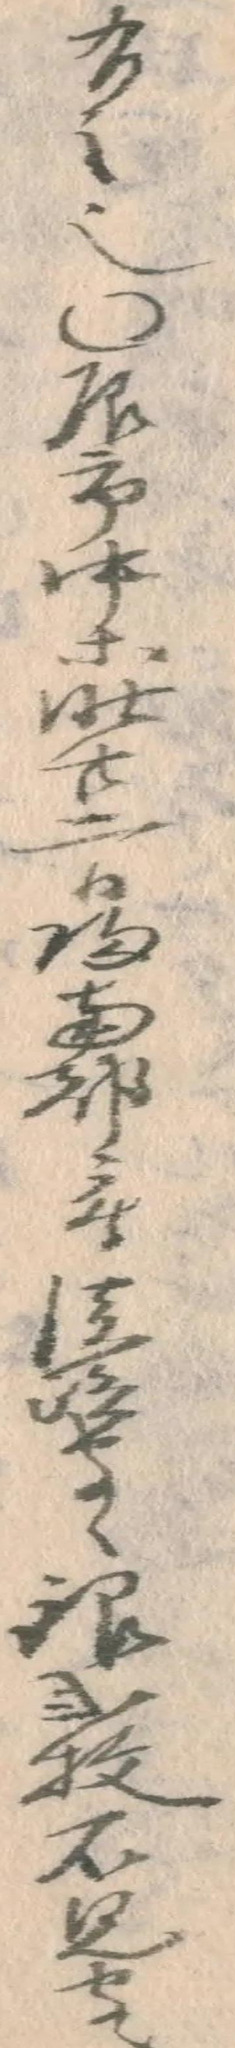有之也○辰市中等昨廿二日帰南都ニ付讃岐守へ銀弐枚石見守へ
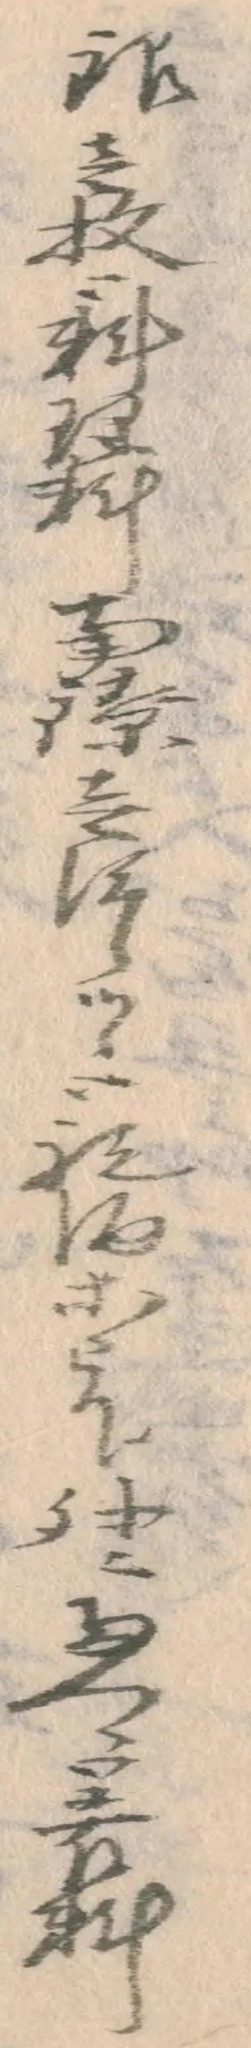銀壱枚御料理料南鐐壱片ツヽ御祝酒等被下外ニ両人ヘ御肴料
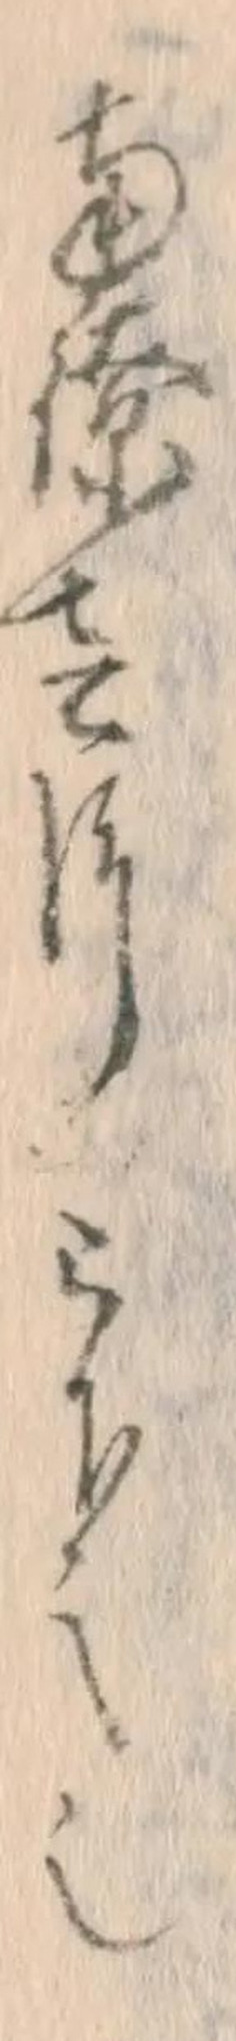南鐐壱片被下之也
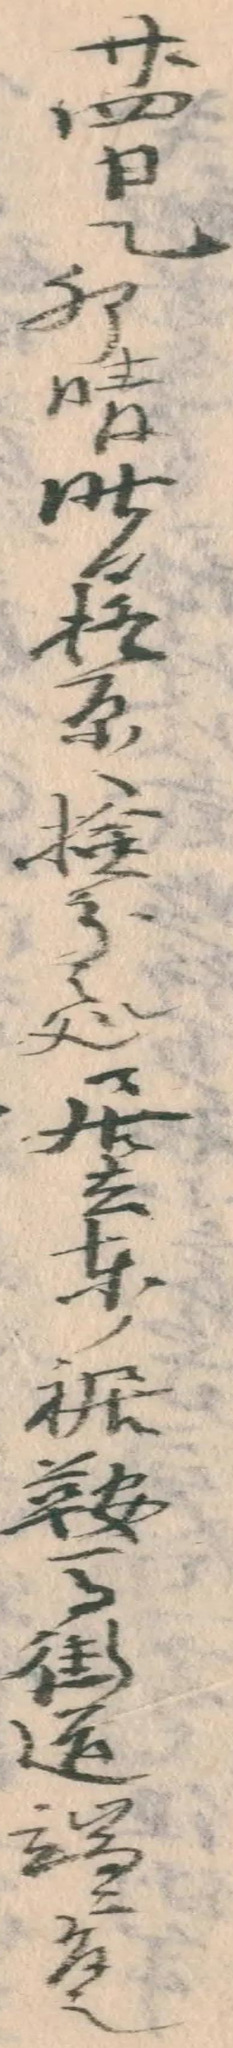廿四日乙卯晴昨日柊原へ検分之処居去東ノ裾鞍馬街道端ニ有之
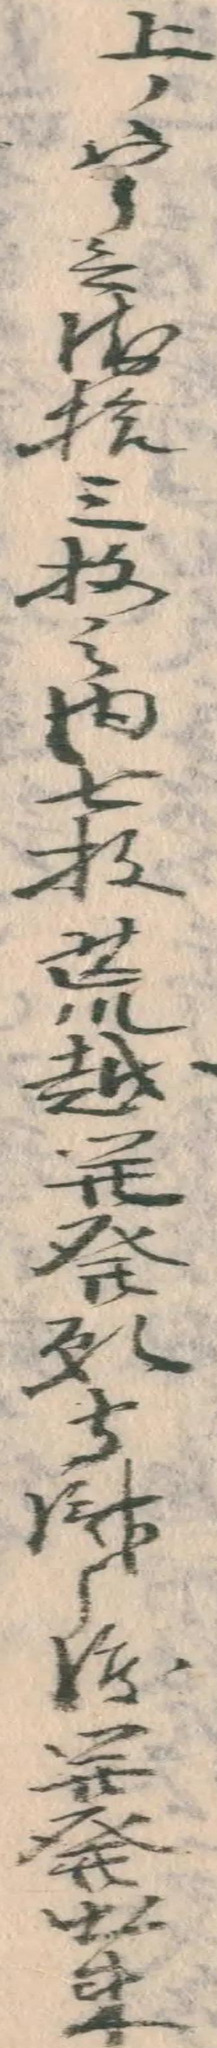上ノ宇兵衛拾三枚之内七枚荒越開発願聞済申渡開発出来
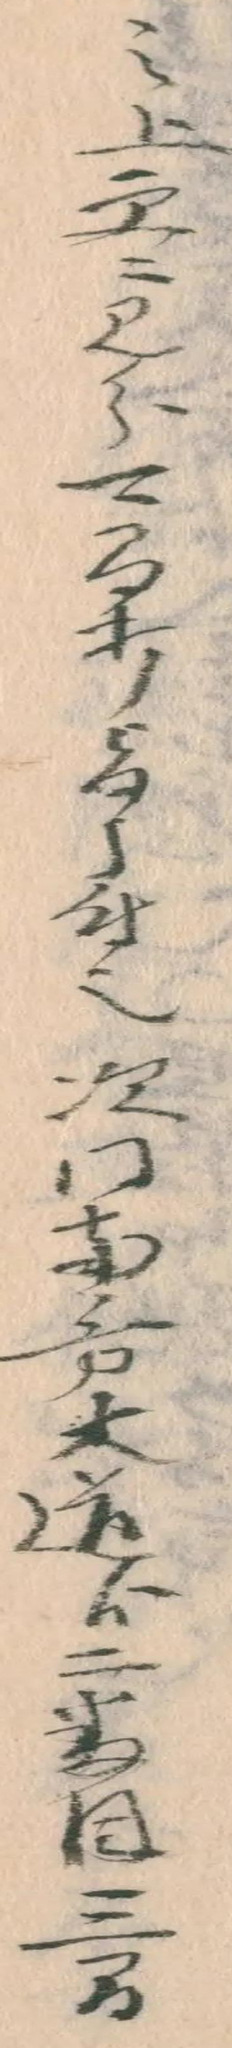之上更に見分可間打旨申付也次同南ノ方大道ゟ二番目三間
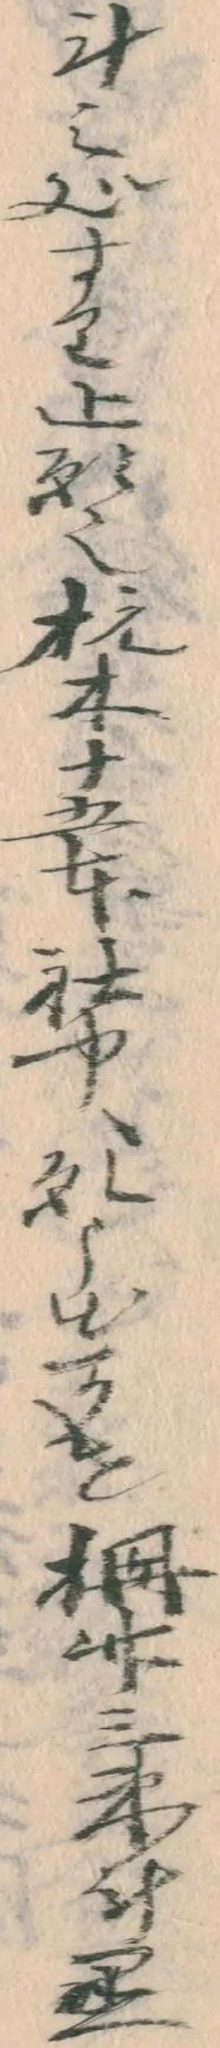斗之処すり止願也杭木十五本社中へ願申出可遣冊卅三束付置
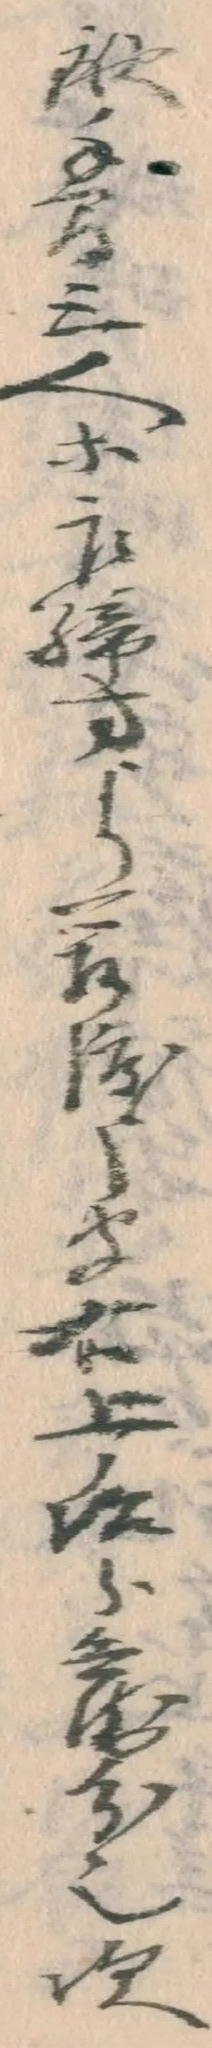鍬手間三人等取締方より可相渡申聞右上ノ次郎兵衛分也次
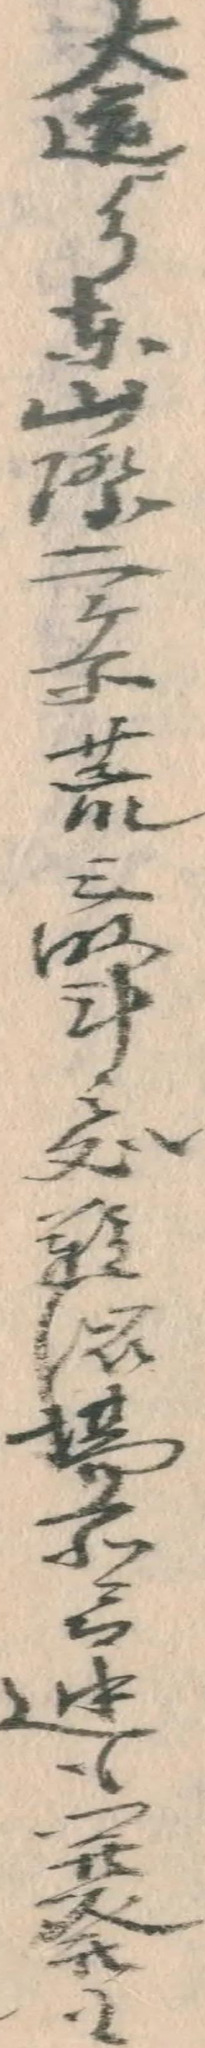大道より東山際二ヶ所荒三畝斗之処難渋場所ニ而迚も開発共
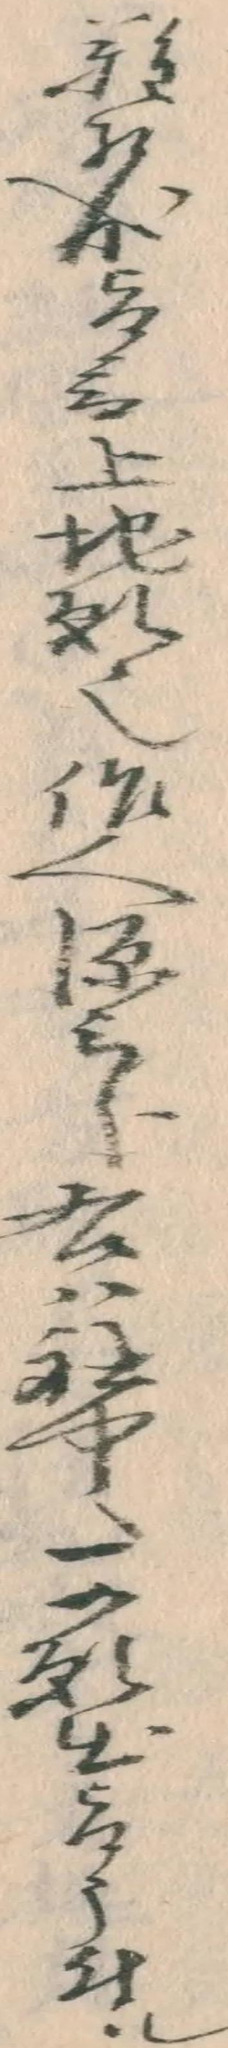難相成旨ニ而上地願也作人源三郎右ハ社中へ可願出旨申付ル
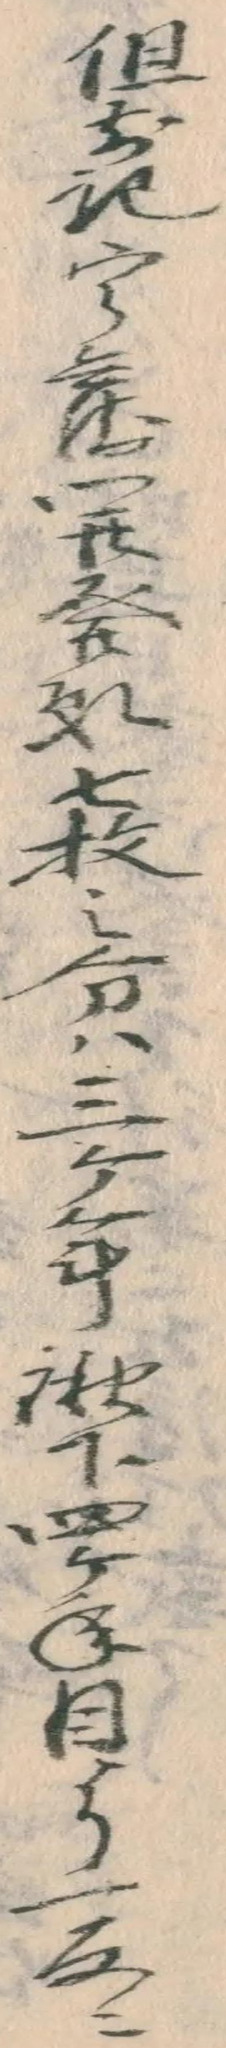但前記宇兵衛開発願七枚之分は三ヶ年鍬下四ヶ年目より一反に
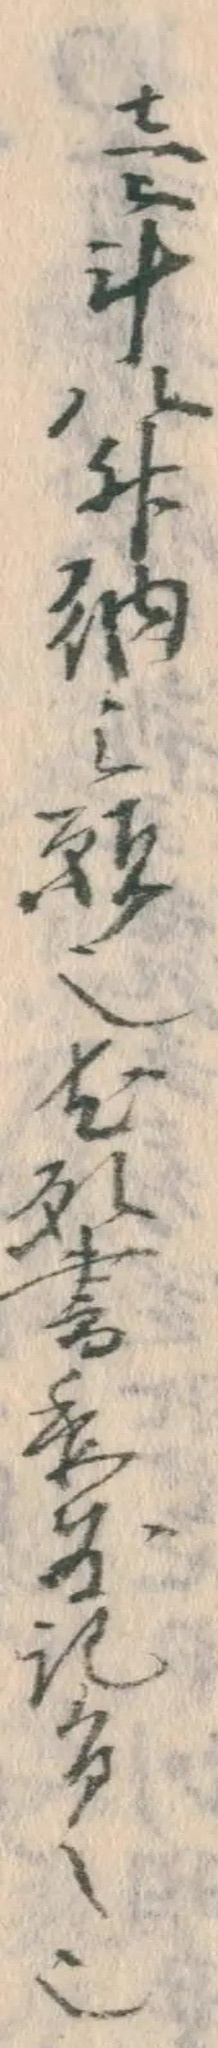壱斗八升納之願也尤願書委敷記有之也
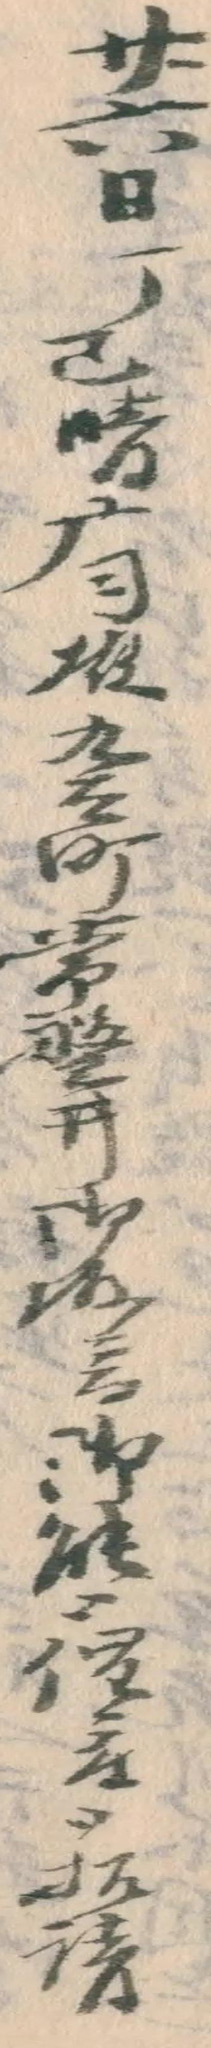廿六日丁巳晴鷹司殿九太町常盤井御城二而御能御催ニ付御招請
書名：賀茂社記録. 第70冊
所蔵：国立国会図書館 National Diet Library, JAPAN
